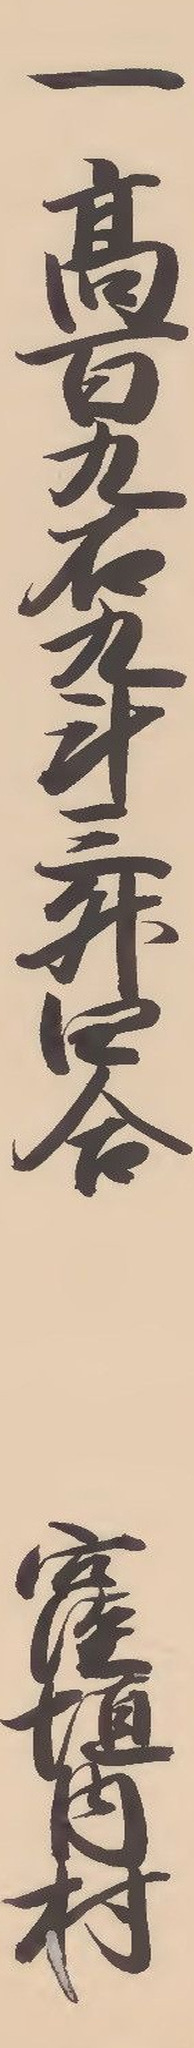一高百九石九斗三升四合窪垣内村
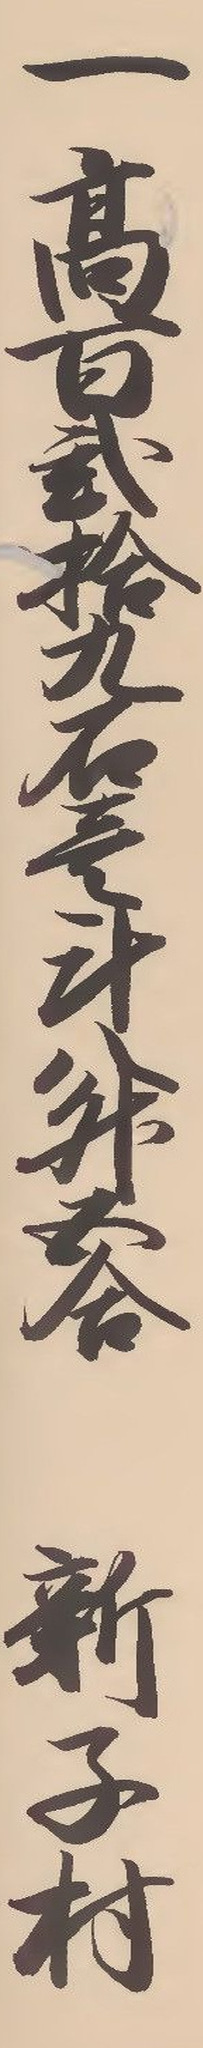一高百弐拾九石壱斗八升五合新子村
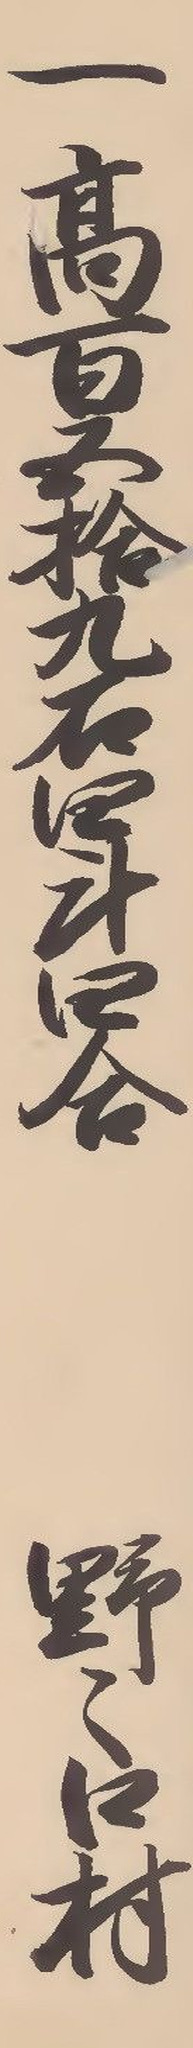一高百五拾九石四斗四合野々口村
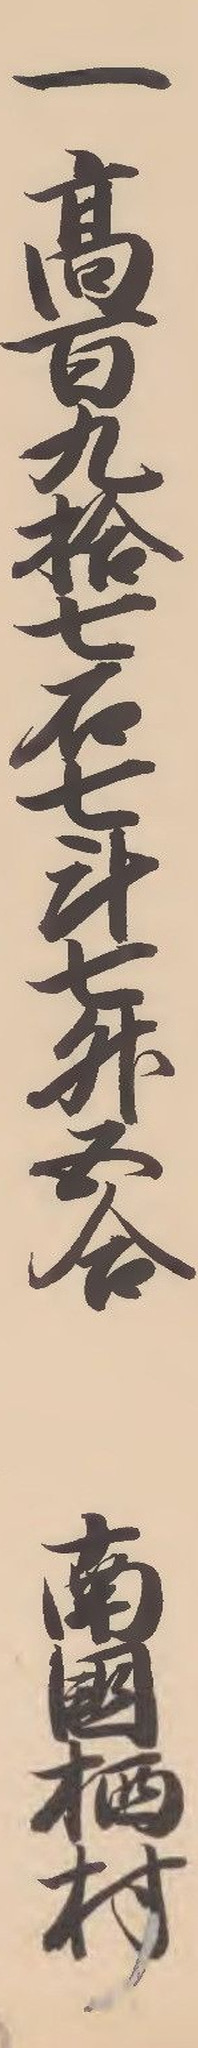一高百九拾七石七斗七升五合南国栖村
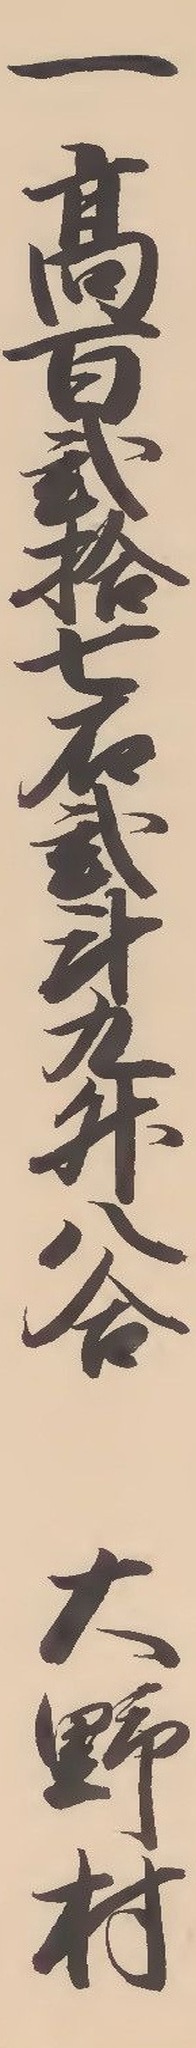一高百弐拾七石弐斗九升八合大野村

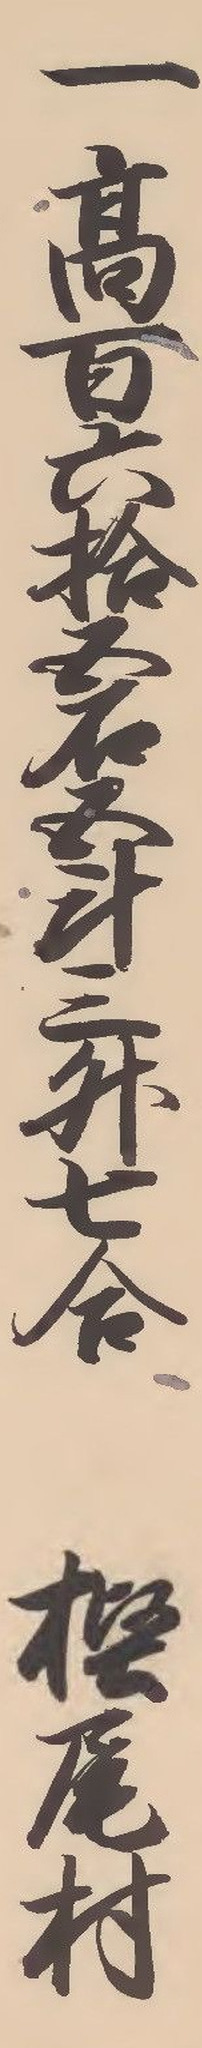一高百六拾五石五斗三升七合樫尾村
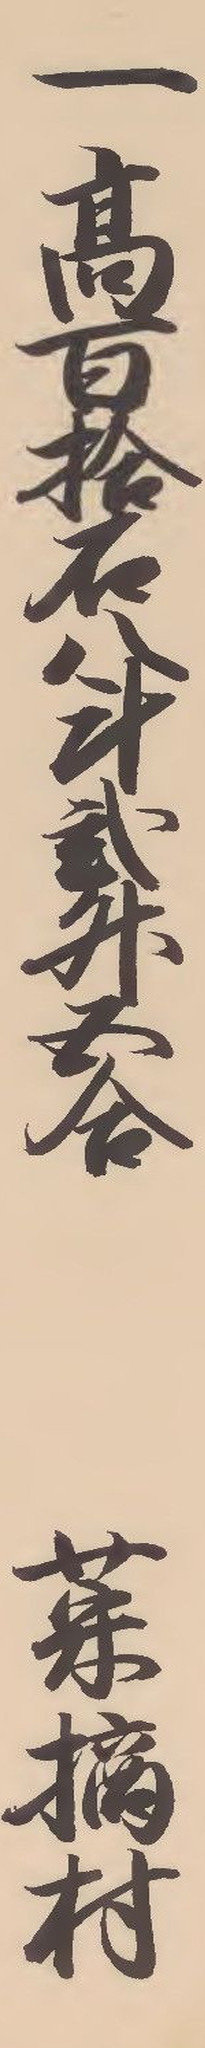一高百拾石八斗弐升五合菜摘村
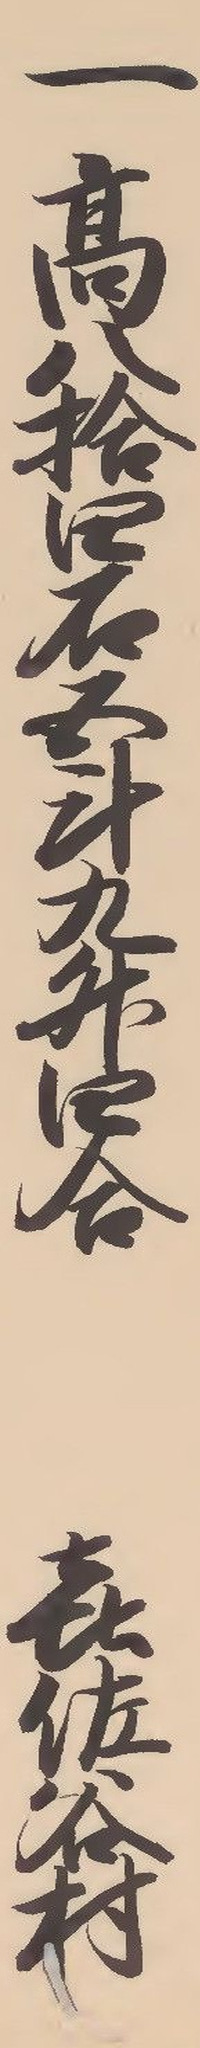一高八拾四石五斗九升四合喜佐谷村
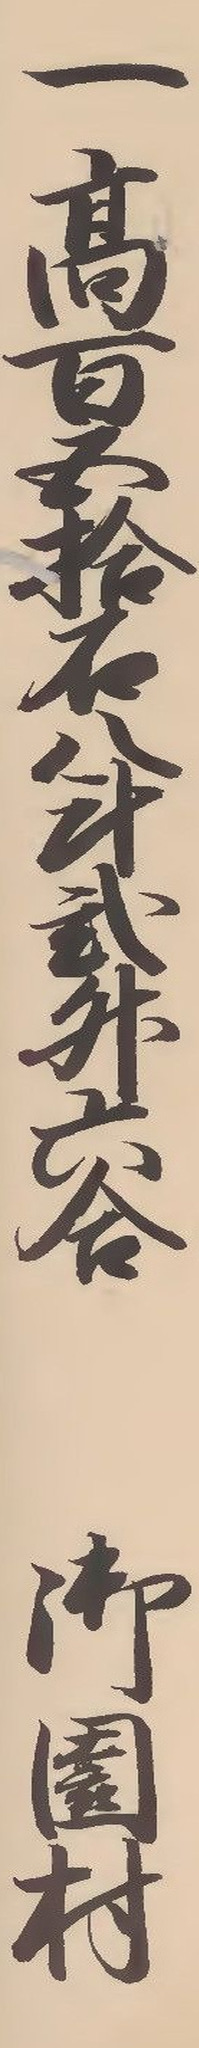一高百五拾石八斗弐升六合御園村
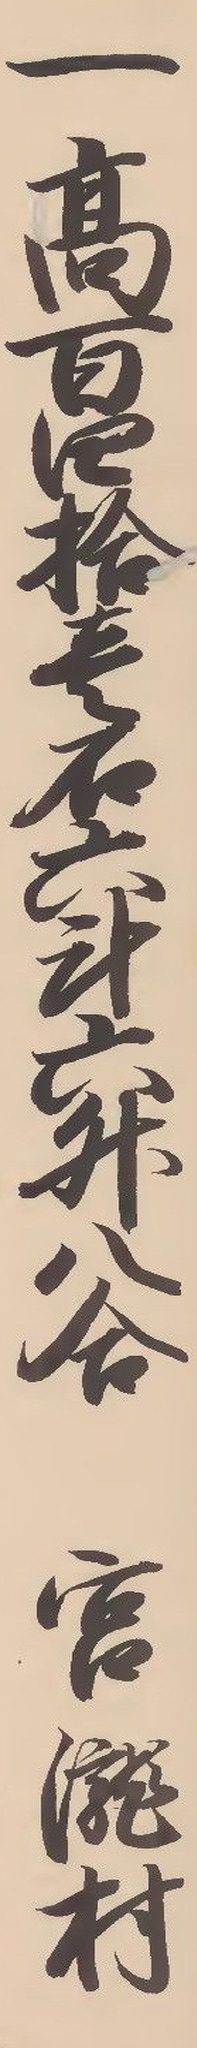一高百四拾壱石六斗六升八合宮滝村
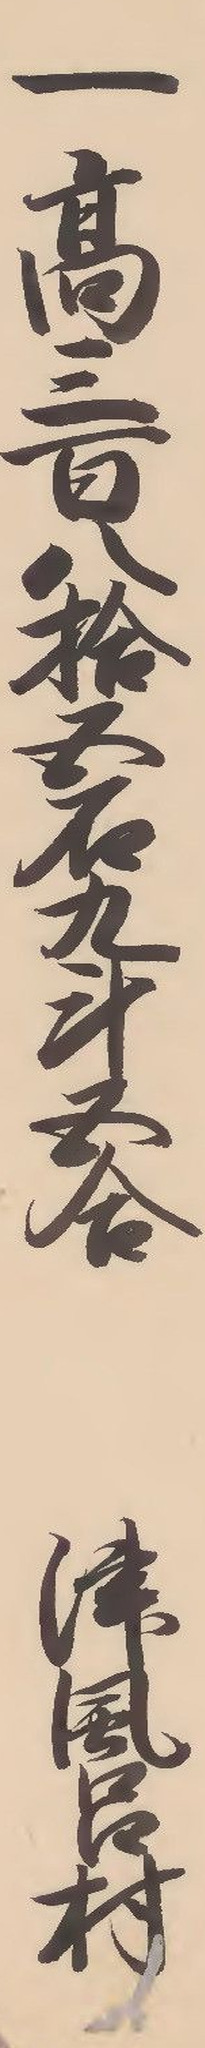一高三百八拾五石九斗五合津風呂村
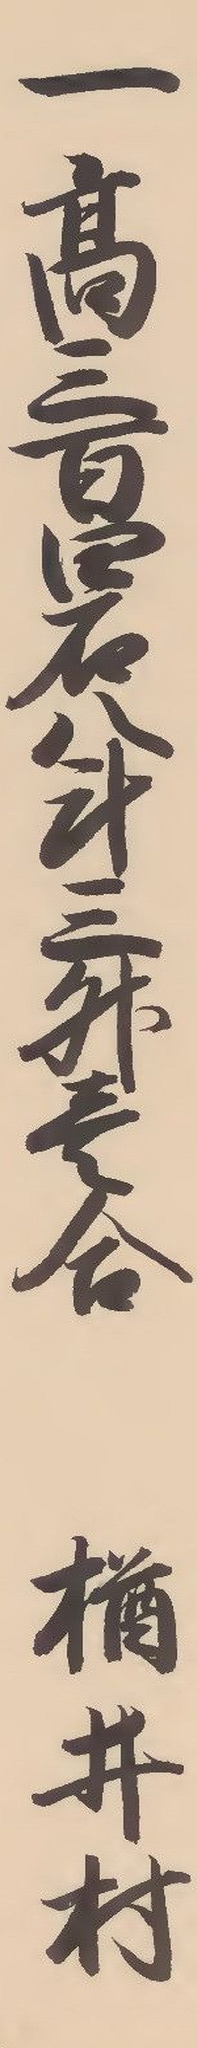一高三百四石八斗三升壱合楢井村
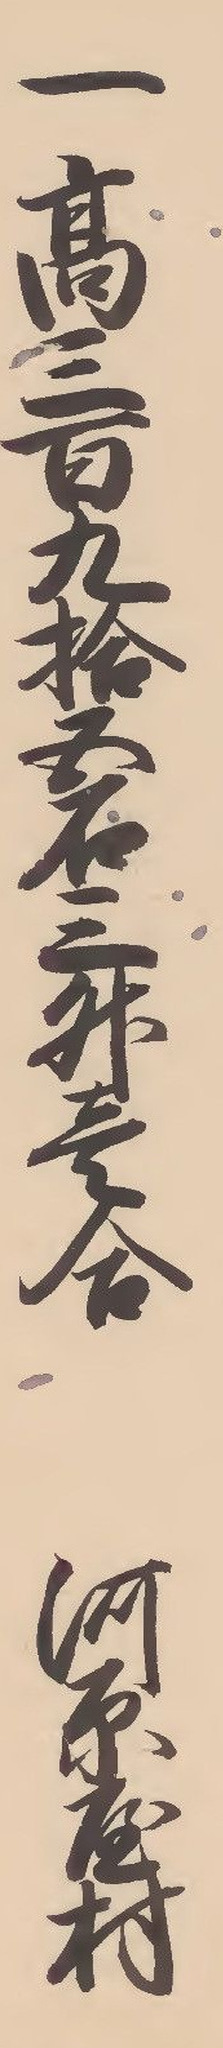一高三百九拾五石三升壱合河原屋村

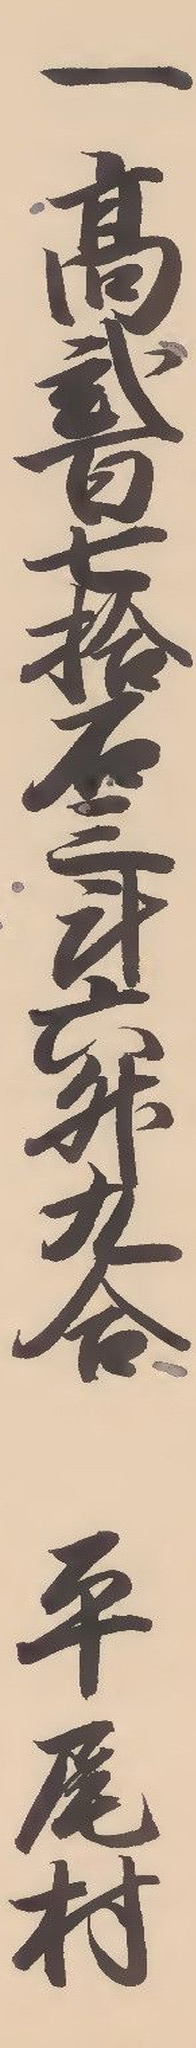一高弐百七拾石三斗六升九合平尾村
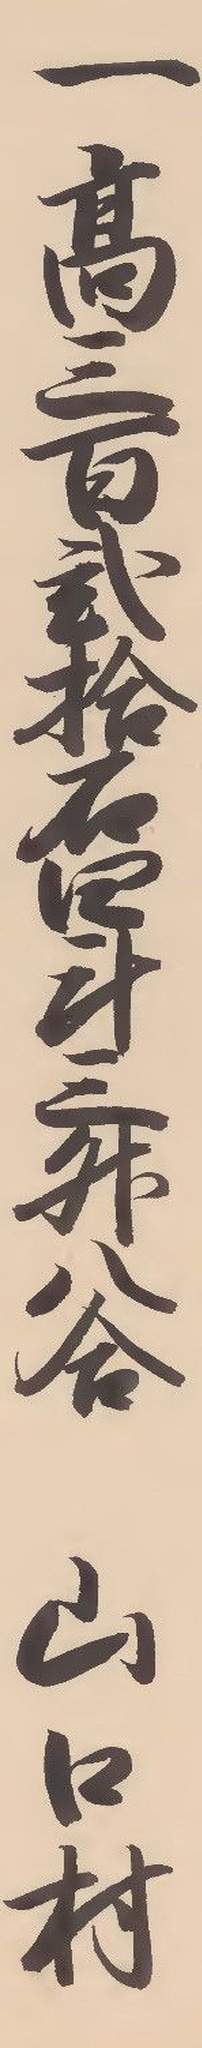一高三百弐拾石四斗三升八合山口村
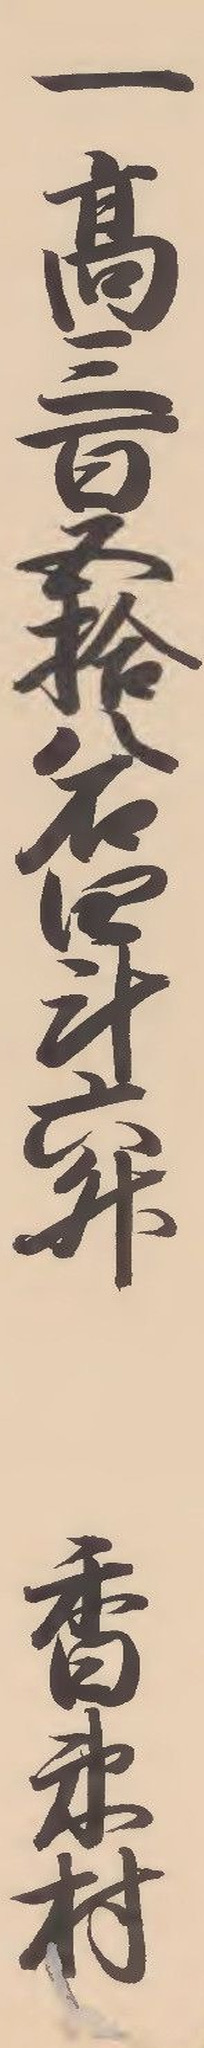一高三百五拾八石四斗六升香束村
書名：大和国郷帳
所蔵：国立公文書館 National Archives of Japan
